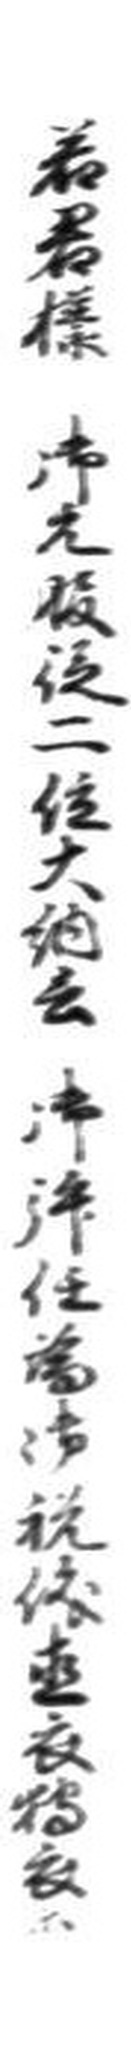若君様御元服従二位大納言御拝任為御祝儀直衣狩衣等

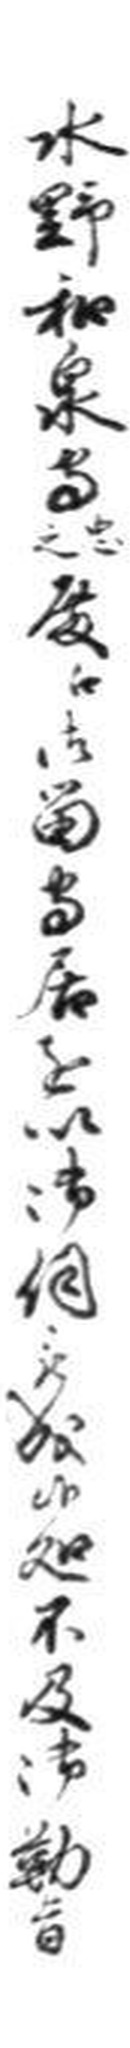水野和泉守忠之殿江御留守居を以御伺被成候処不及御勤旨
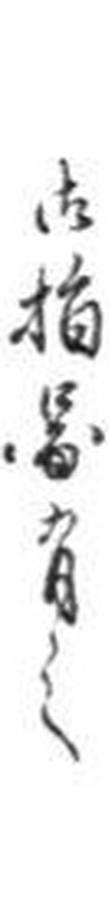御指図有之
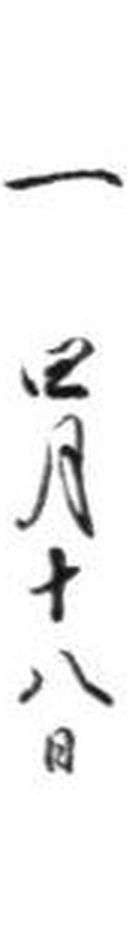一四月十八日
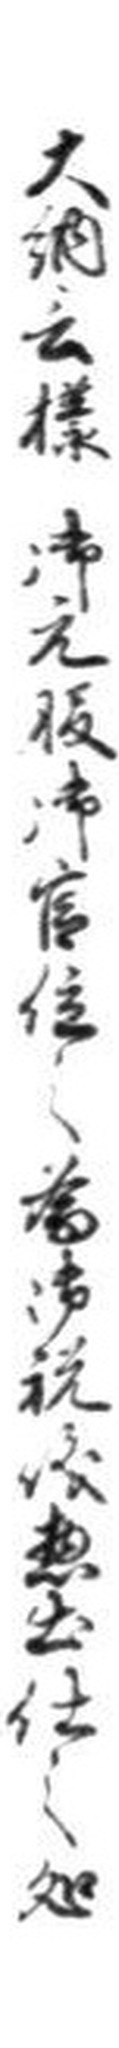大納言様御元服御官位之為御祝儀惣出仕之処
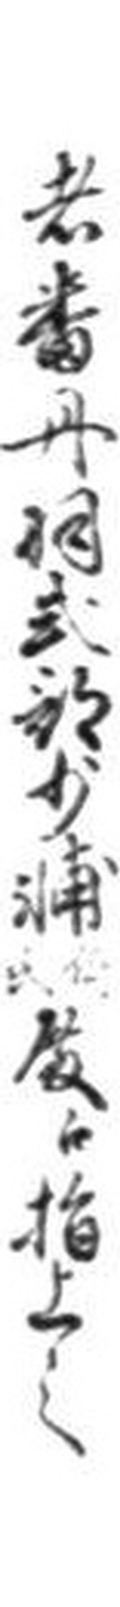者番丹羽式部少輔薫氏殿江指上之
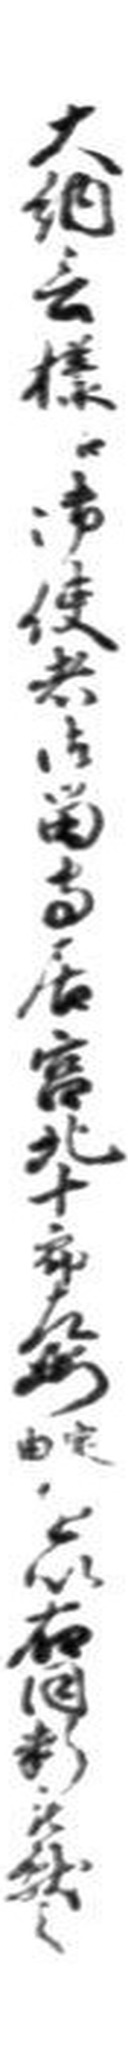大納言様江御使者御留守居宮北十郎左衛門定由を以右同断被献之
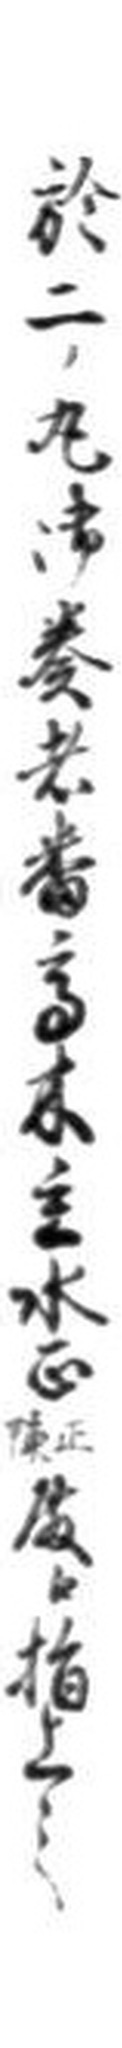於二ノ丸御奏者番高木主水正正陳殿江指上之
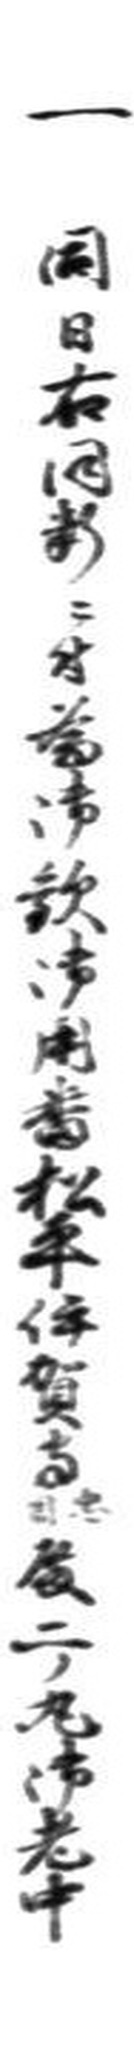一同日右同断ニ付為御歓御用番松平伊賀守忠周殿二ノ丸御老中
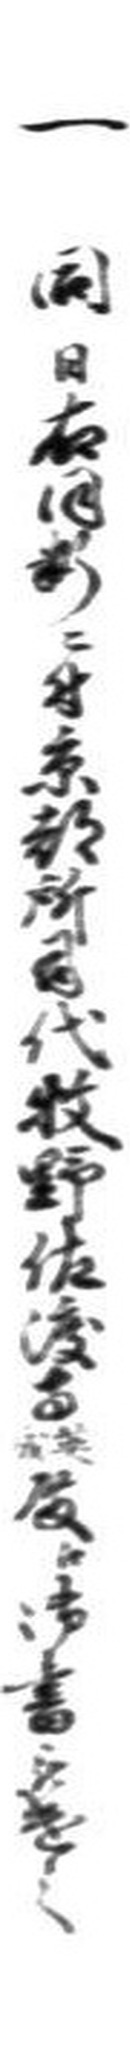一同日右同断ニ付京都所司代牧野佐渡守英成殿江御書被遣之
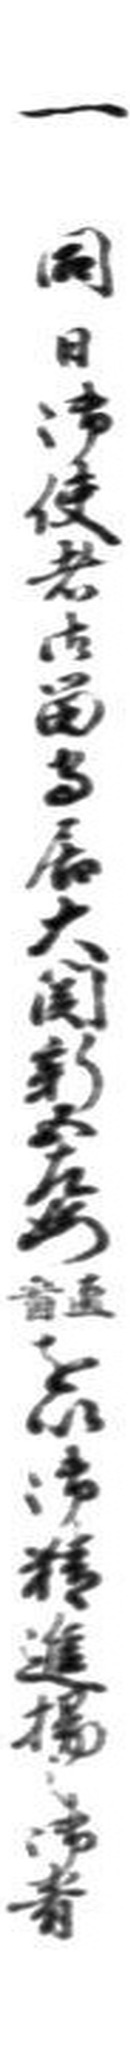一同日御使者御留守居大関新五左衛門直看を以御精進揚之御肴
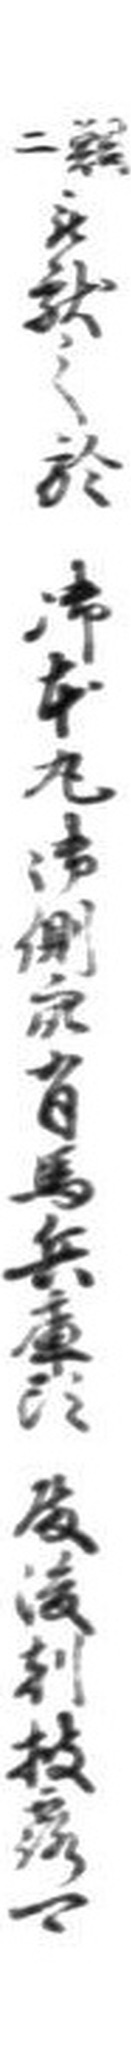鯉二被献之於御本丸御側衆有馬兵庫頭殿後刻披露可
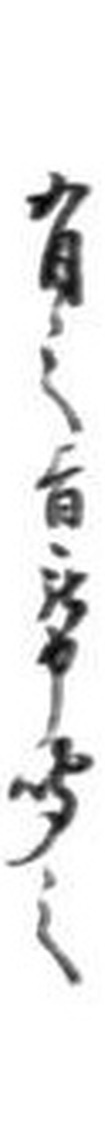有之旨被申聞之
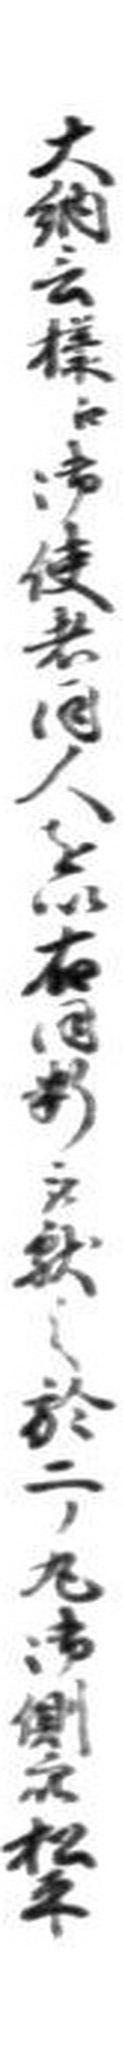大納言様江御使者同人を以右同断被献之於二ノ丸御側衆松平
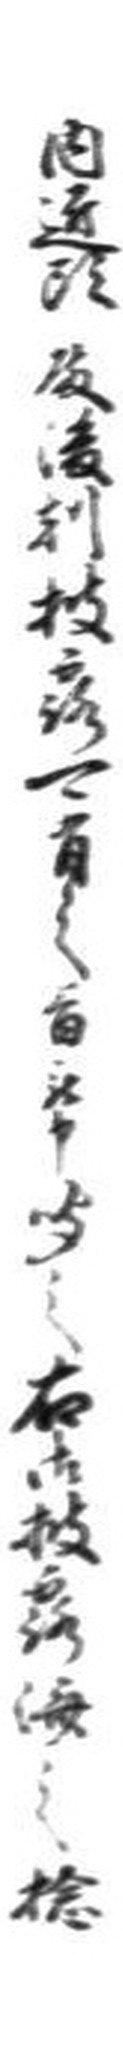内匠頭殿後刻披露可有之旨被申聞之右御披露済之捻

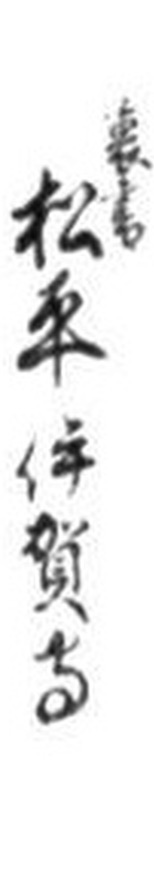松平伊賀守
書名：家譜 三十九 宗矩公 享保十年
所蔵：福井県文書館 Fukui Prefectural Archives
